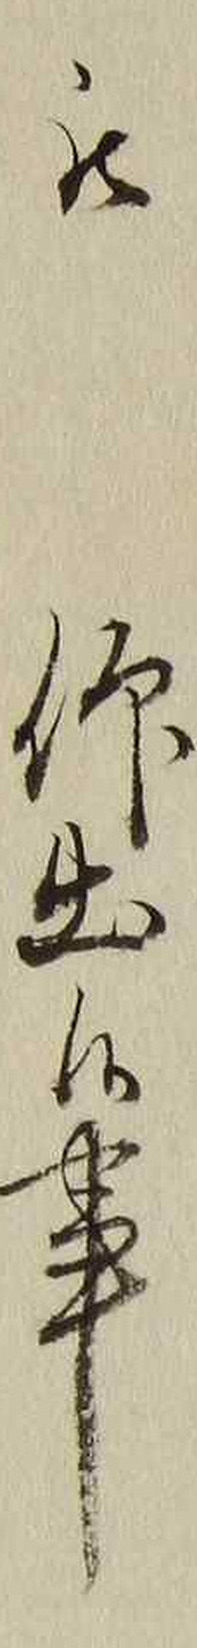被仰出候事
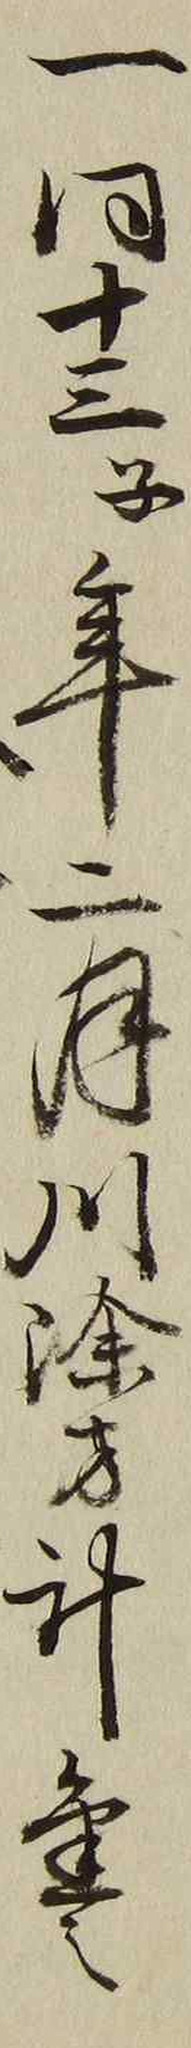一同十三子年二月川除方計金之
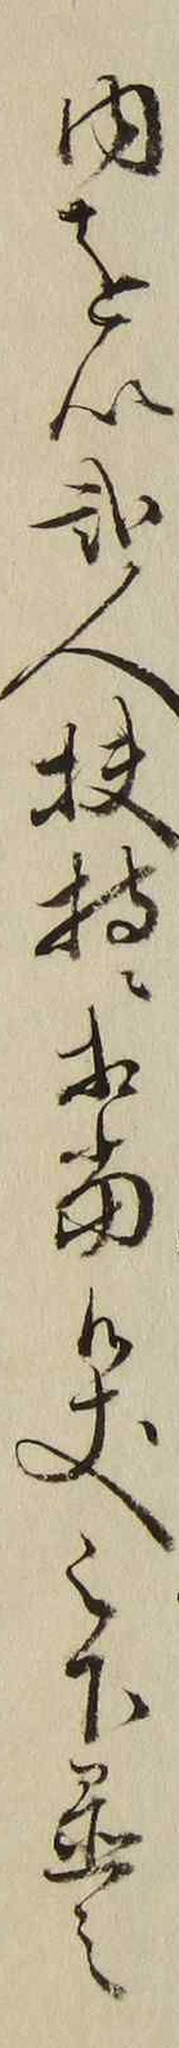内を以弐人扶持ニ相当候丈被下置之

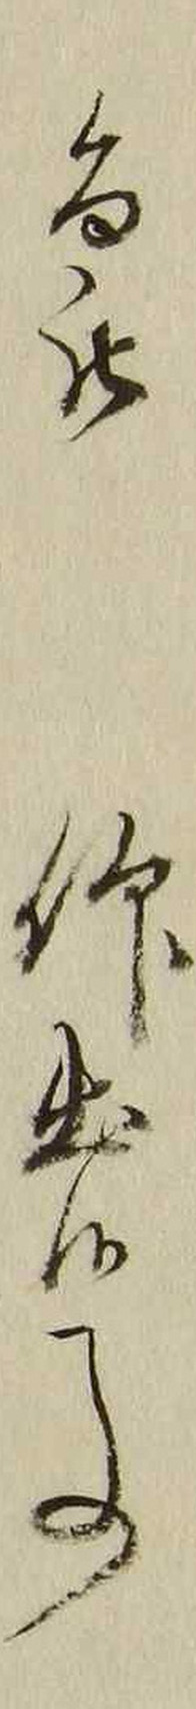旨被仰出候事
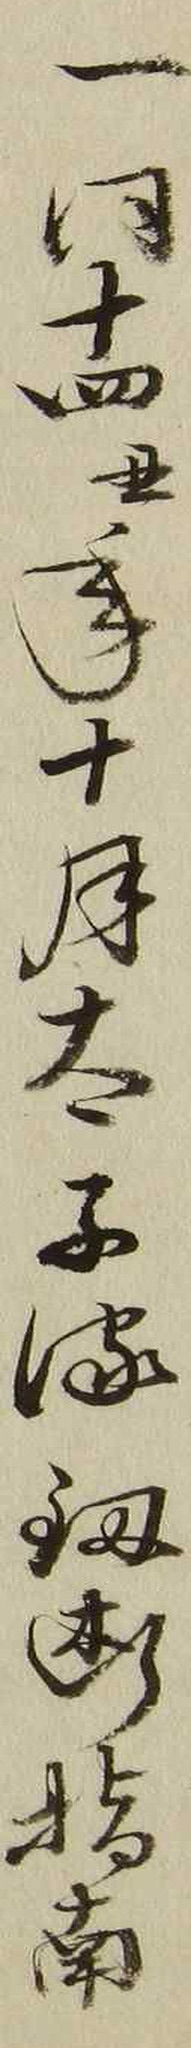一同十四丑年十月太子流剣術指南
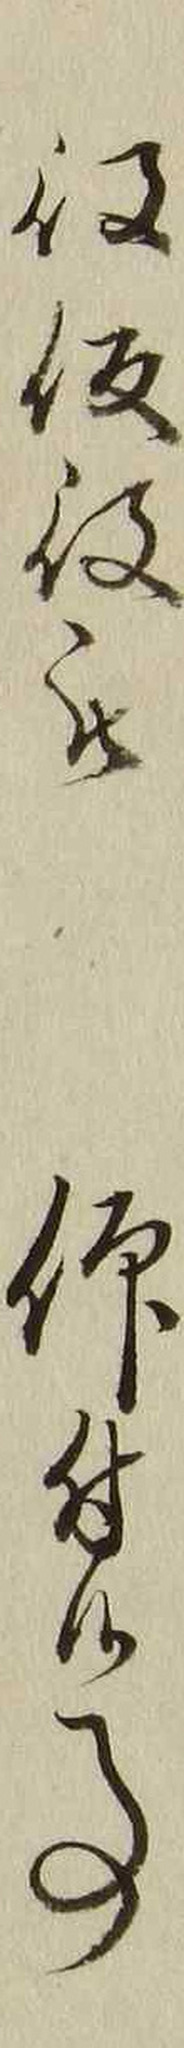役仮役被仰付候事
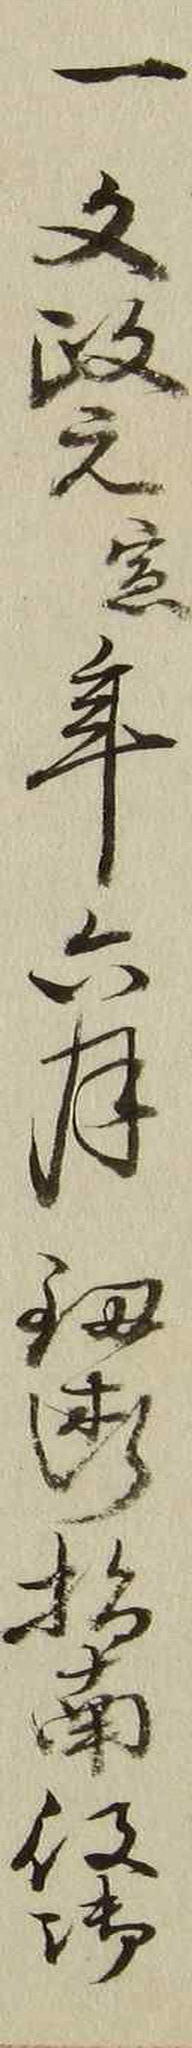一文政元寅年六月剣術指南役御
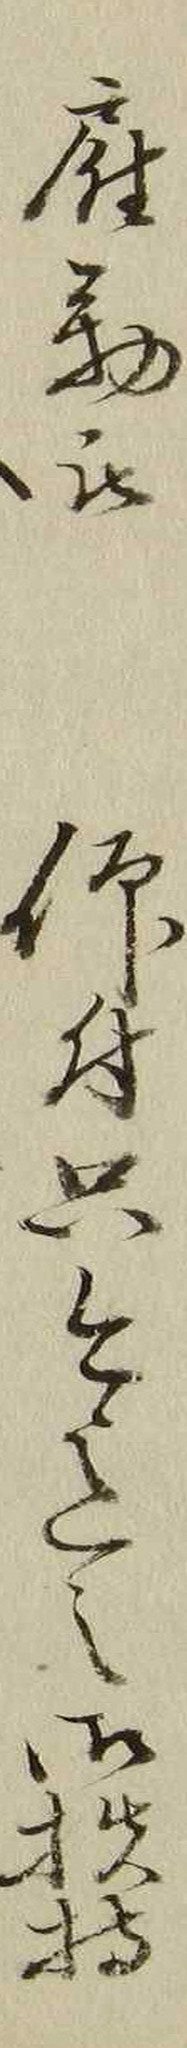雇勤被仰付只今迄之御扶持
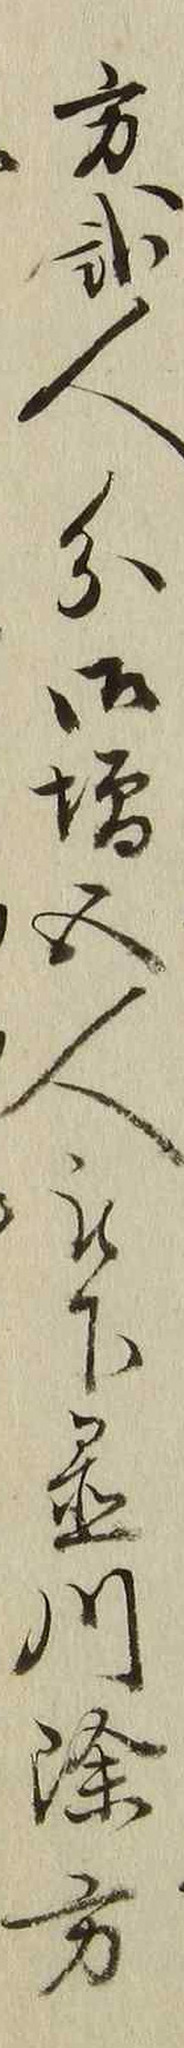方へ弐人分御増五人被下置川除方
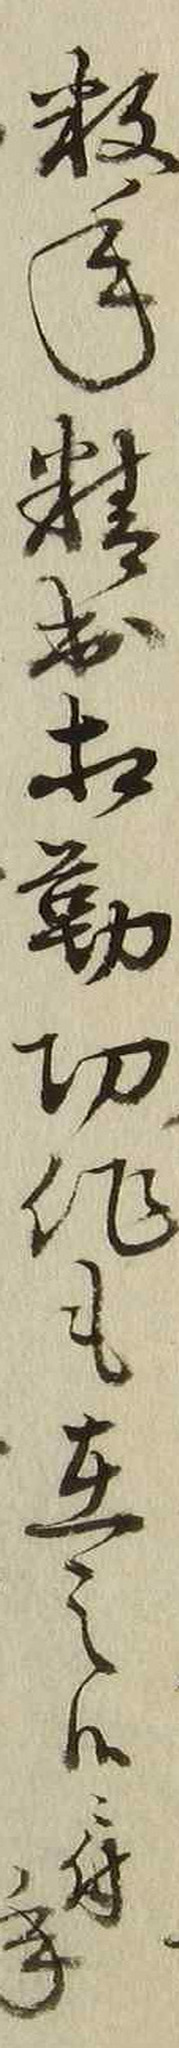数年精出相勤功作も在之候ニ付年
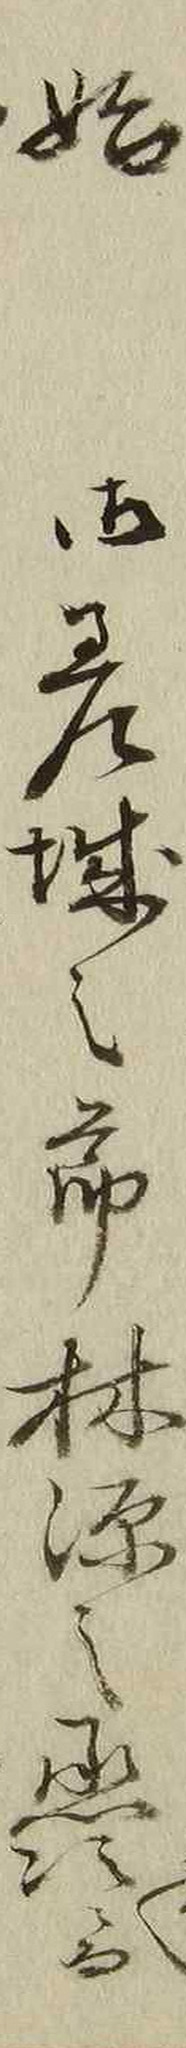始御差城之節林源之丞次ニ而
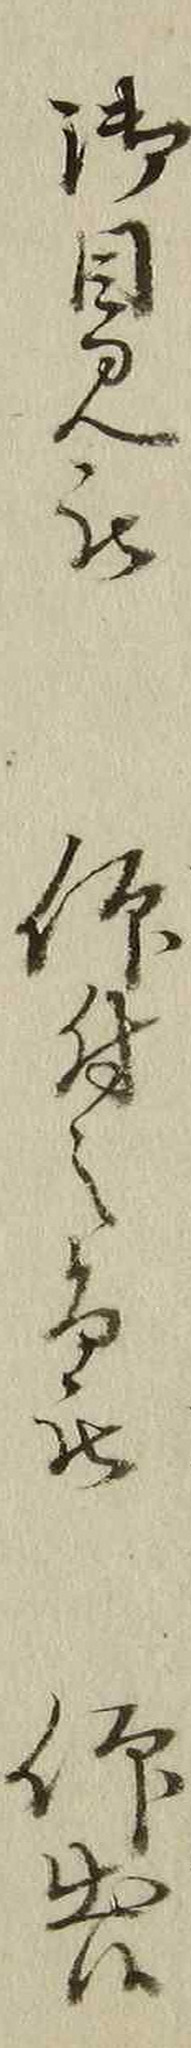御目見被仰付之旨被仰出候
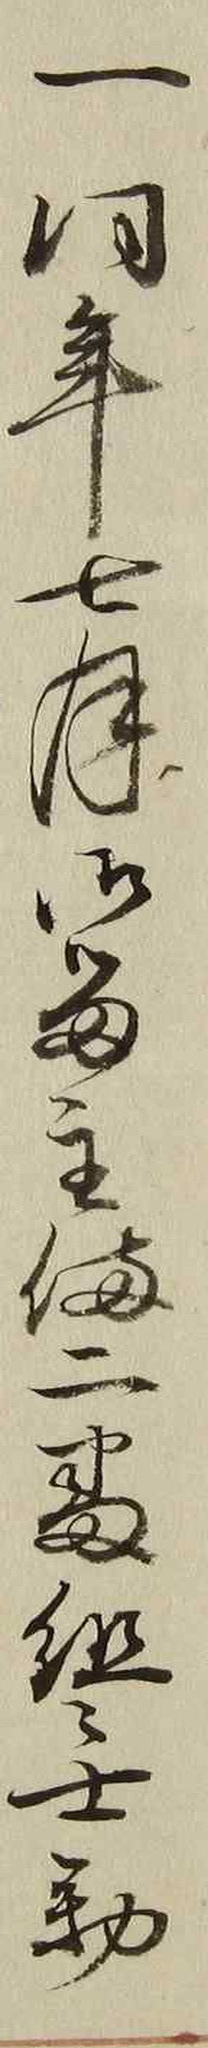一同年七月御留主備二番組々士勤
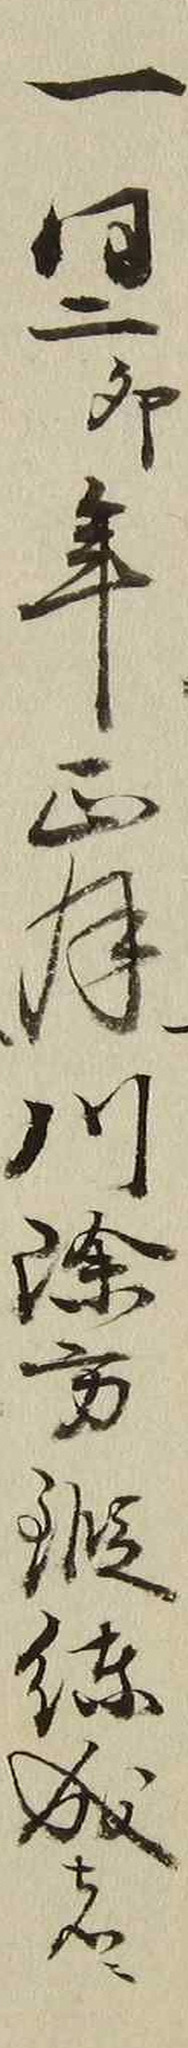一同二卯年正月川除方鍛練成者ニ
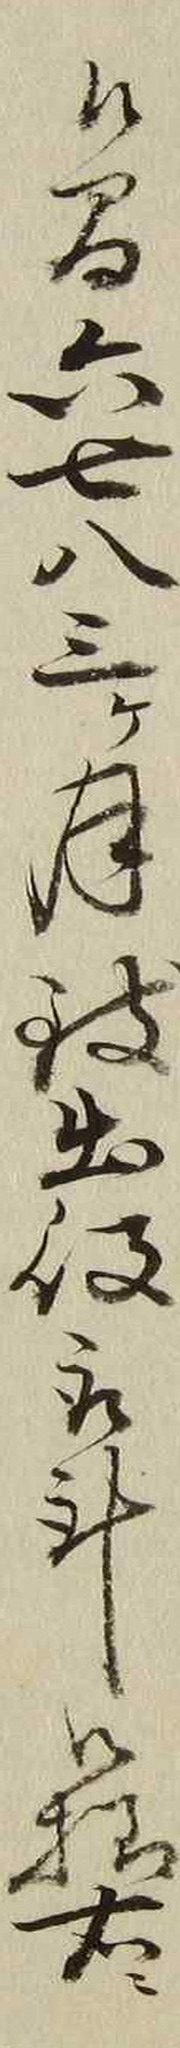候間六七八三ヶ月致出役取計候様右ニ
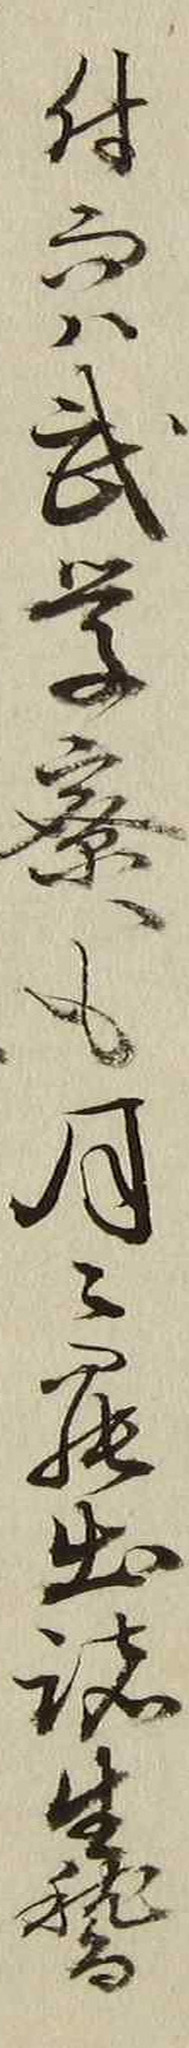付而ハ武学寮へも月々罷出諸生稽
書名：諸士系譜　巻之36　は之部4
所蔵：会津若松市立会津図書館
